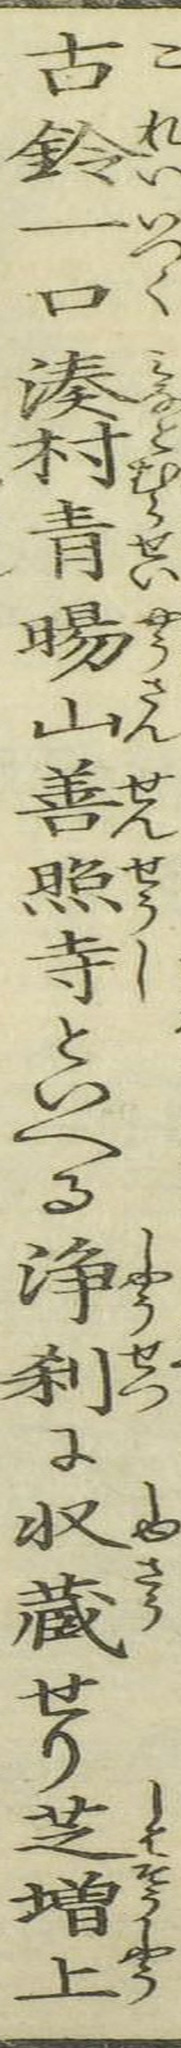古鈴一口湊村青暘山善照寺といへる浄刹に収蔵せり芝増上
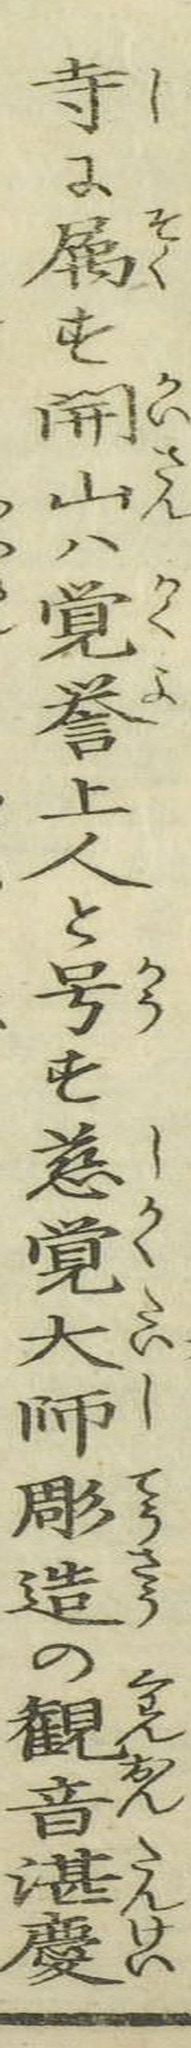寺に属す開山は覚誉上人と号す慈覚大師彫像の観音湛慶
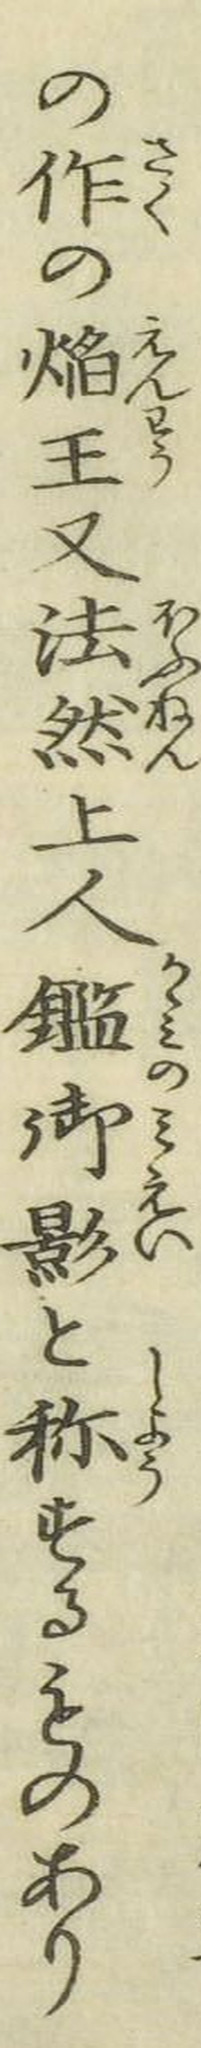の作の焔王又法然上人鑑御影と称するものあり
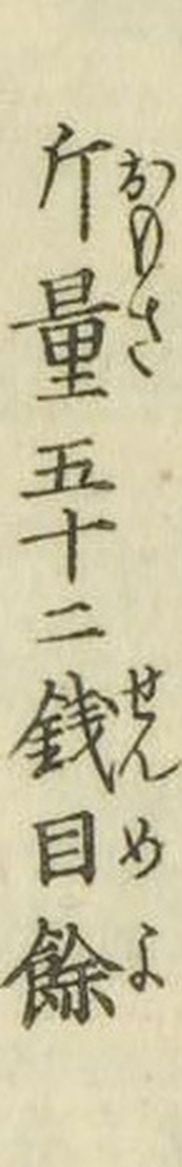斤量五十二銭目余
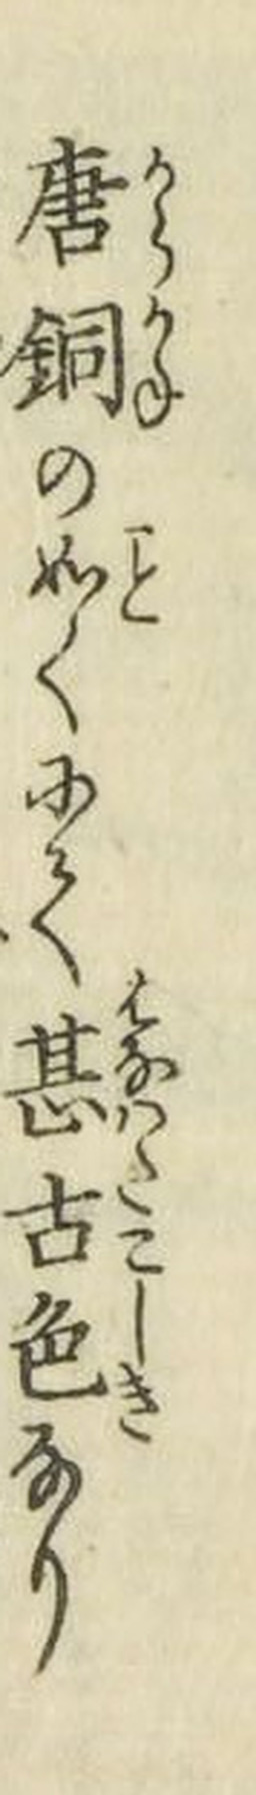唐銅の如くにて甚古色なり
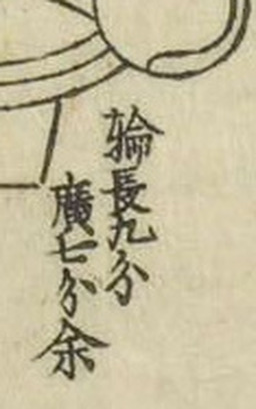輪長九分
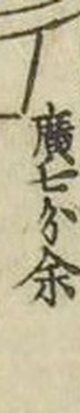広七分余
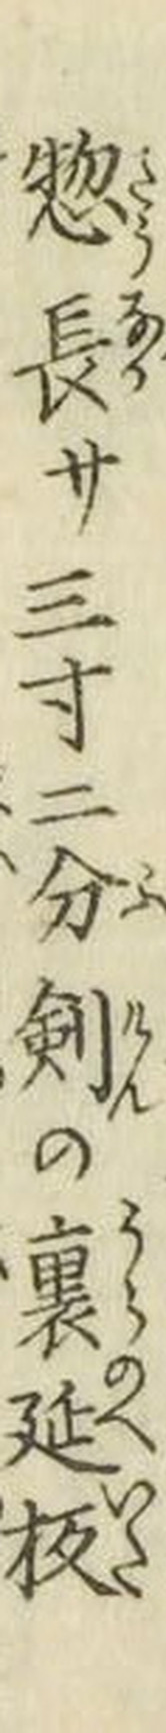総長さ三寸二分剣の裏延板
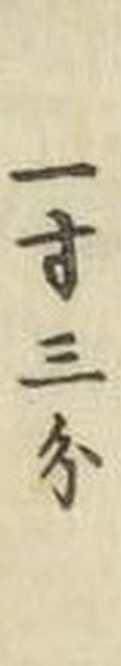一寸三分
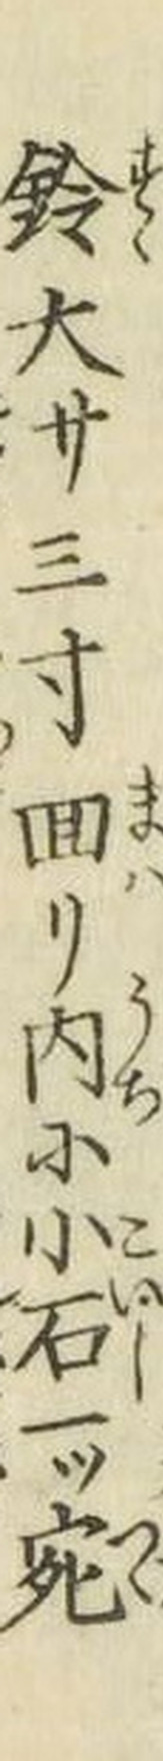鈴大さ三寸回り内に小石一つ宛
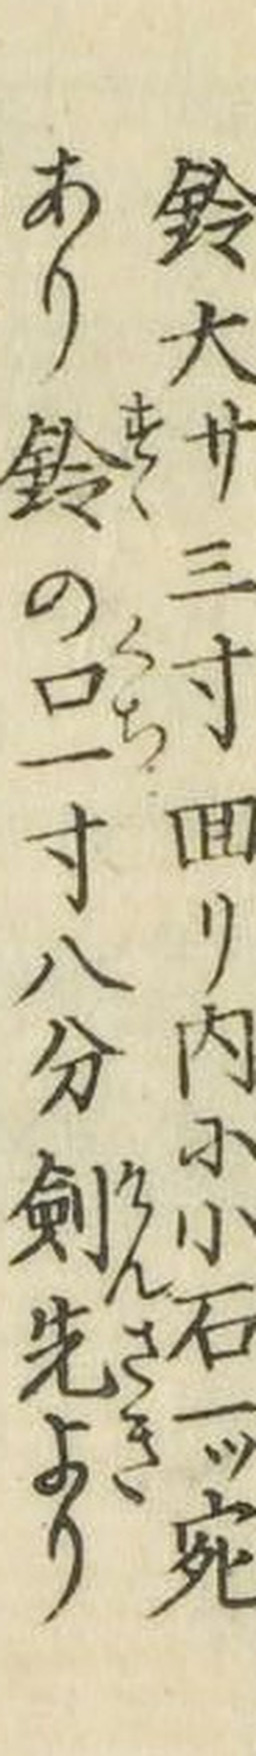あり鈴の口一寸八分剣先より
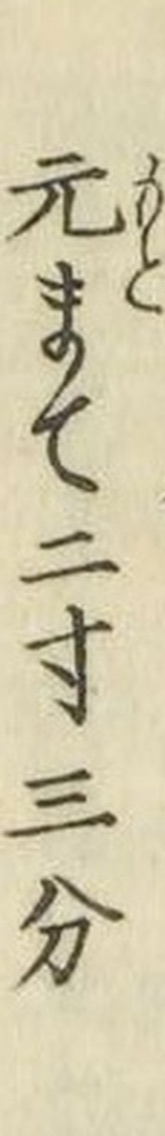元まて二寸三分
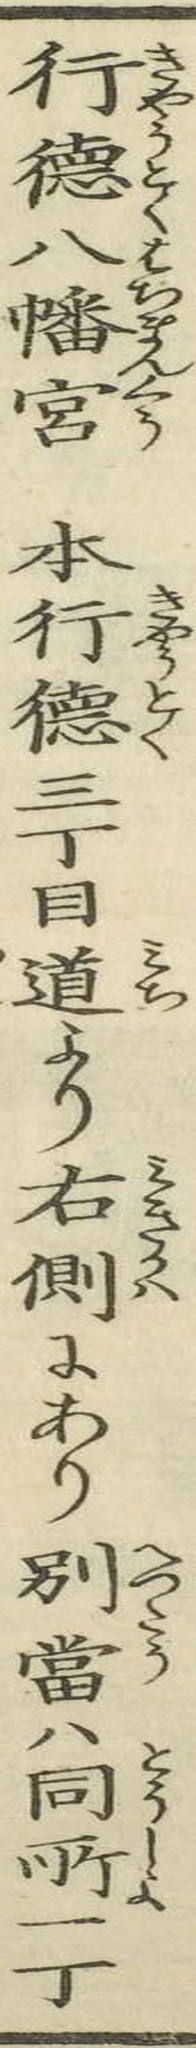行徳八幡宮本行徳三丁目道より右側にあり別当は同所一丁
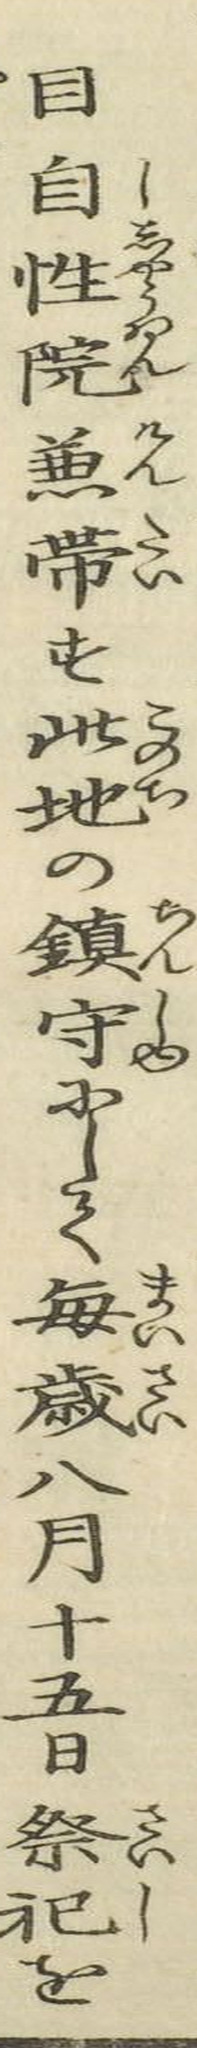目自性院兼帯す此地の鎮守にして毎歳八月十五日祭祀を
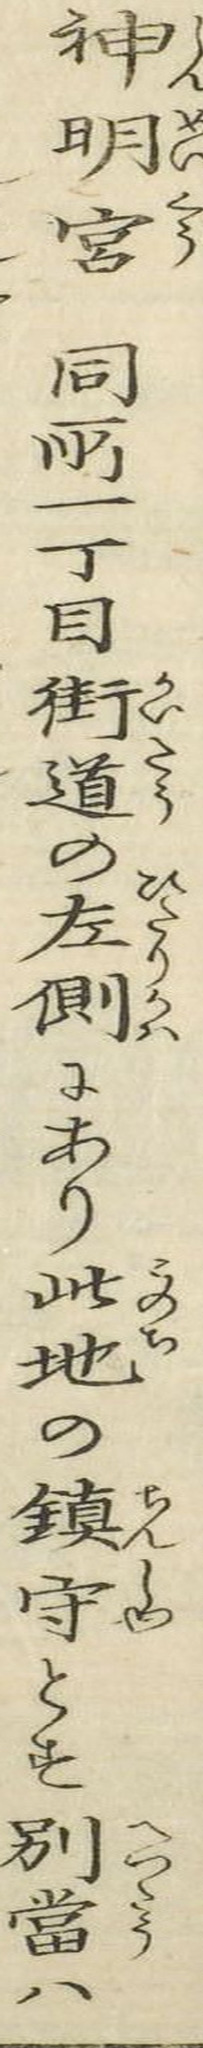神明宮同所一丁目街道の左側にあり此地の鎮守とす別当は
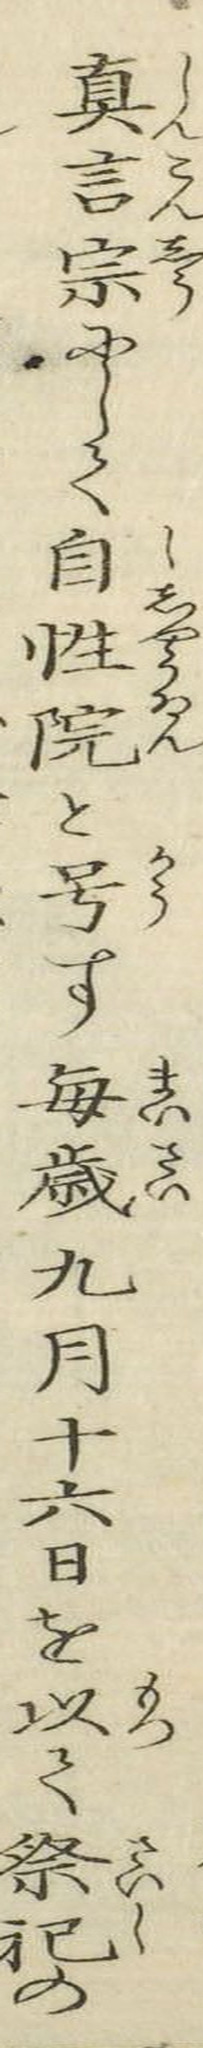真言宗にして自称院と号す毎歳九月十六日を以て祭祀の
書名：江戸名所図会 20巻 巻之20
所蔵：東京学芸大学教育コンテンツアーカイブ
